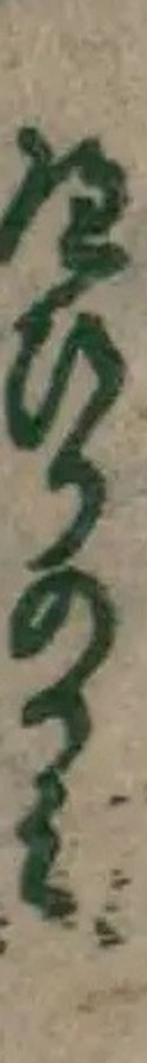屁ひりのかみ
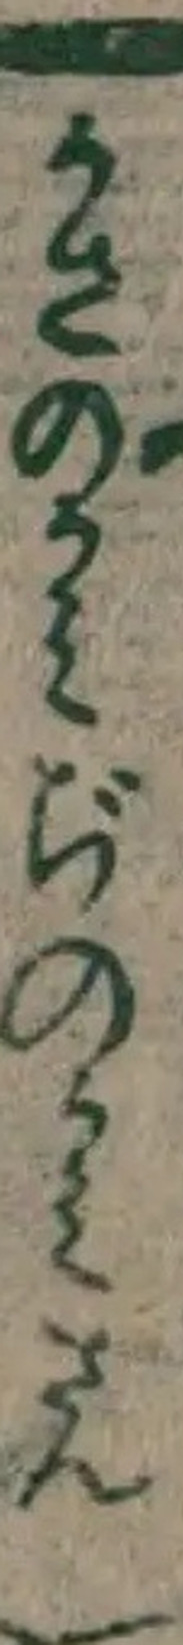かさのかみぢのかみさん
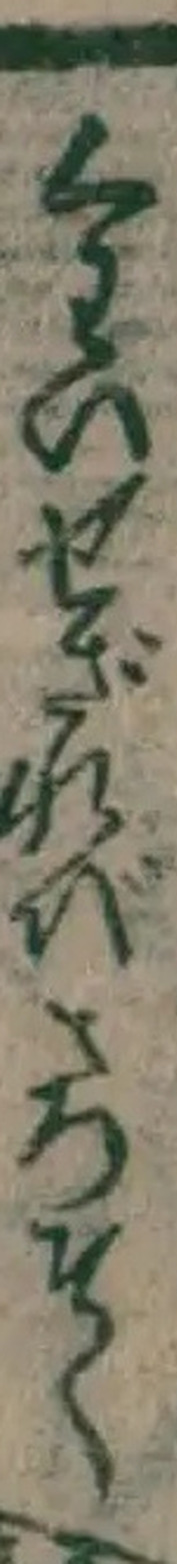くわいせざればさつそく
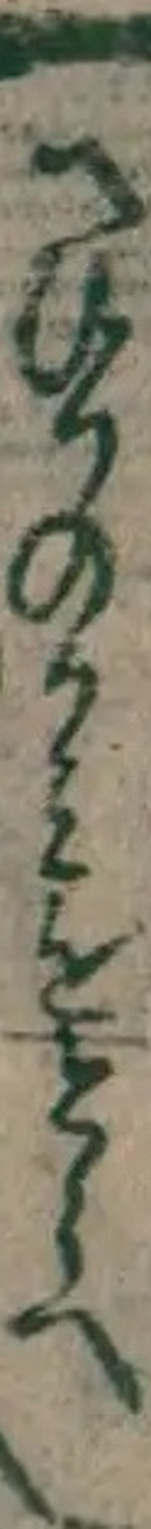へひりのかみをとらへ
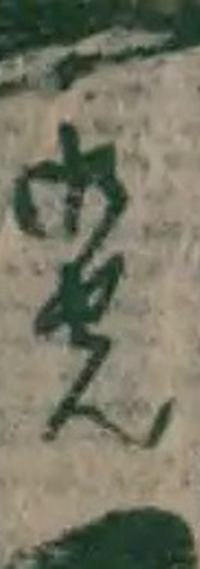御せん
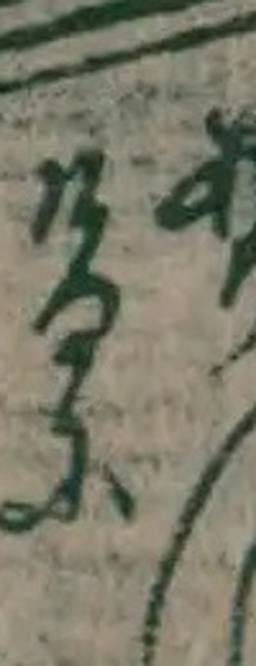けるに
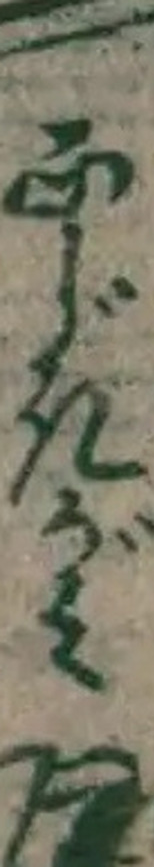正じきがみ
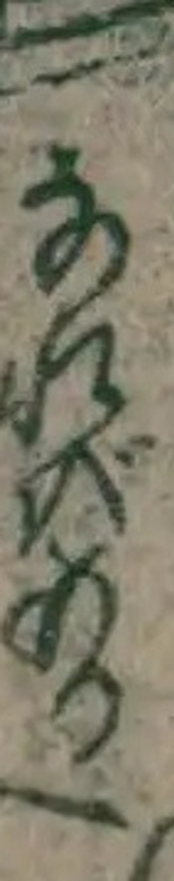なればあり
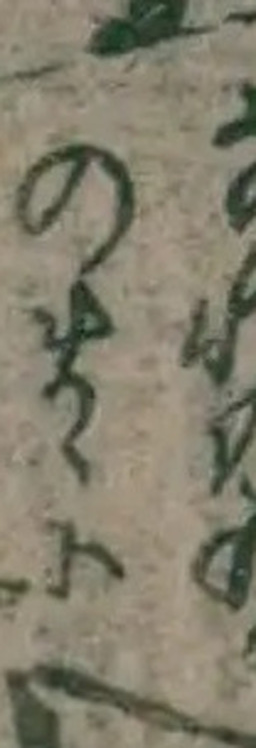のまゝに
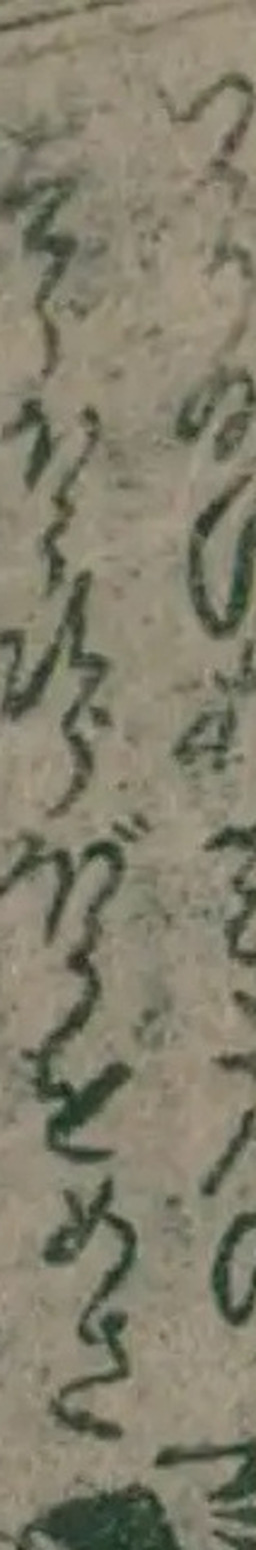太らほう次らぼうをめさ
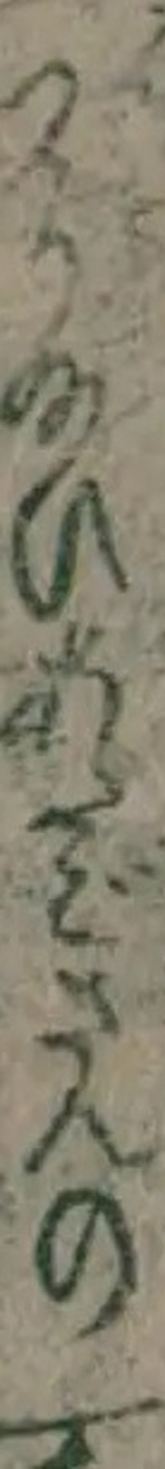いかり給ひあたごさんの
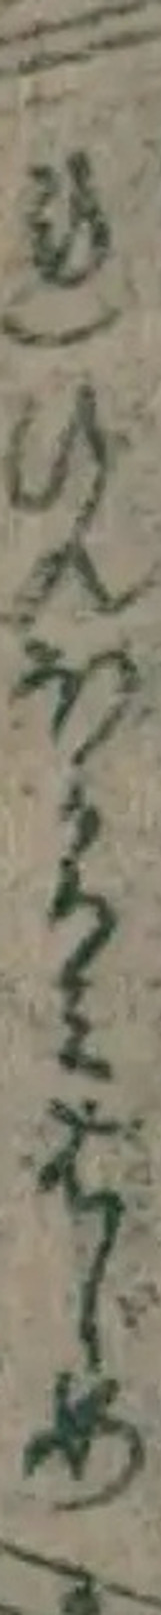れひんほうかみはじめ
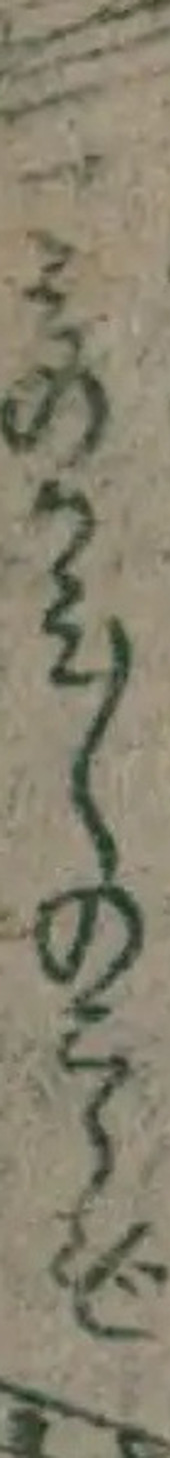一みのかみ〳〵のこらず

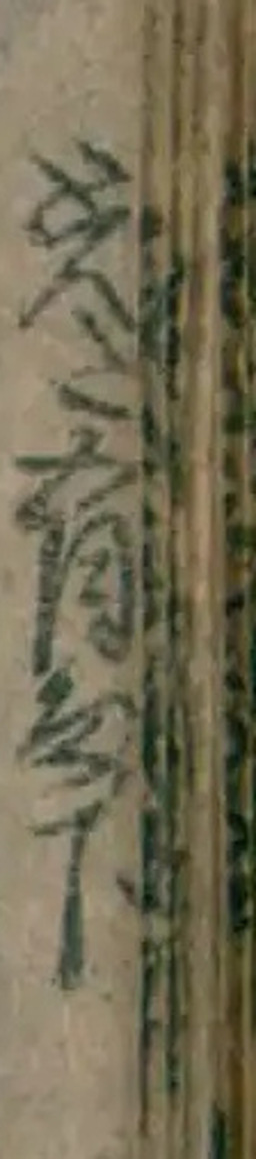とんた五月雨下
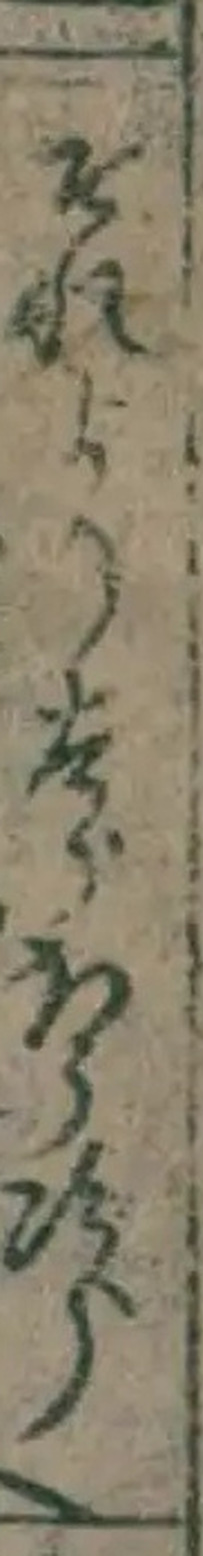それより太らほう次ら
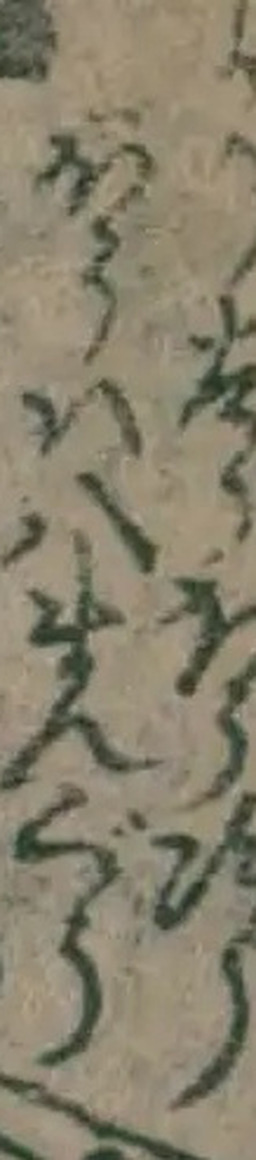ぼうは八まんぐう
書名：頓作時雨月 3巻
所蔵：国立国会図書館 National Diet Library, JAPAN
